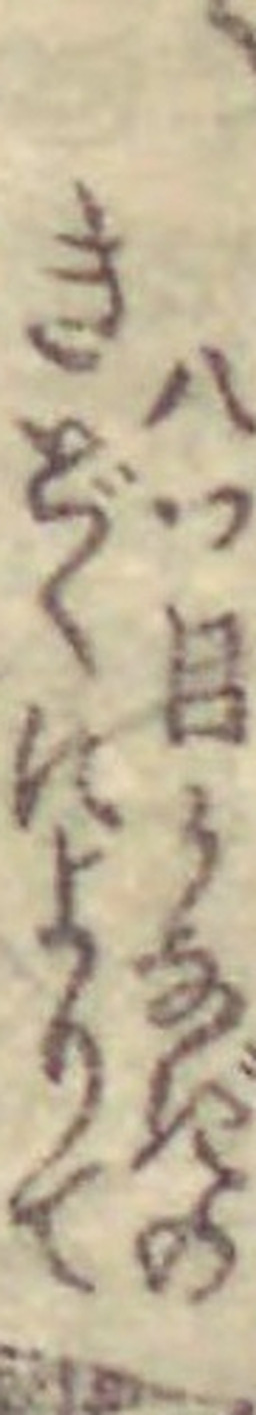きどくによりて
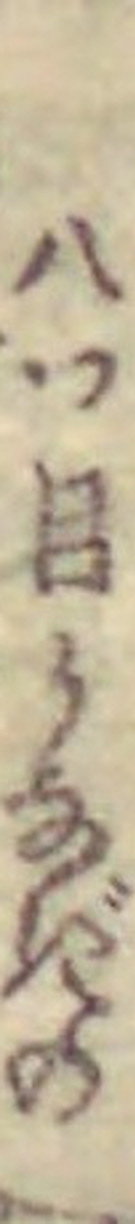八ッ目うなぎの
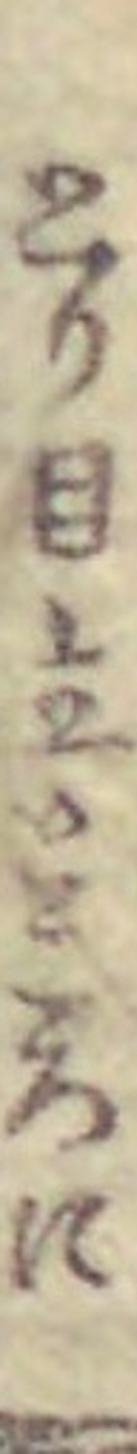とり目立ところに
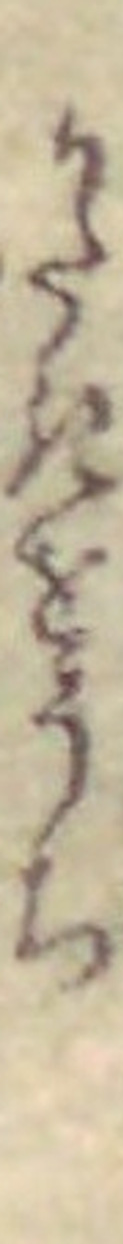かたきをうち
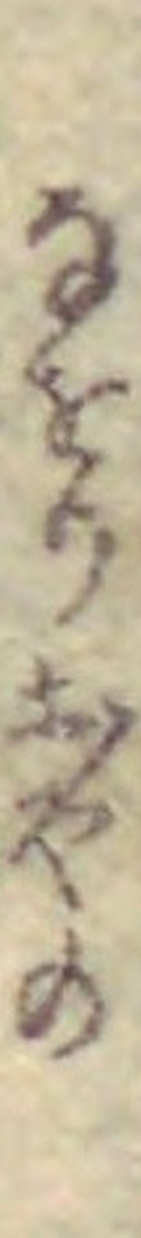なをりおやの
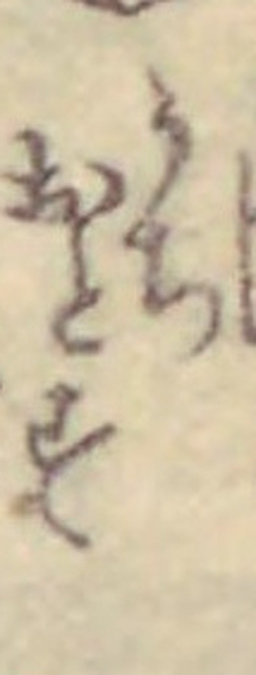おとす
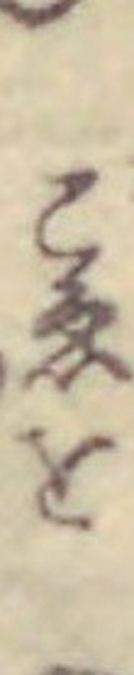こゑを
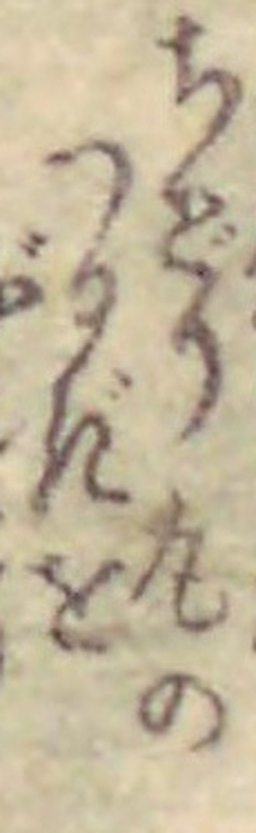つるぎを
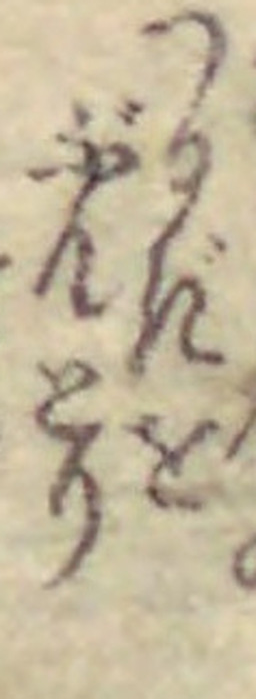ぶんどり
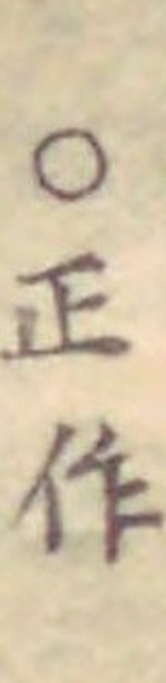○正作
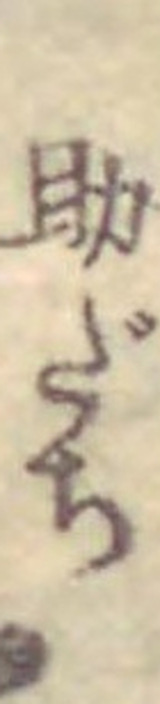助だち
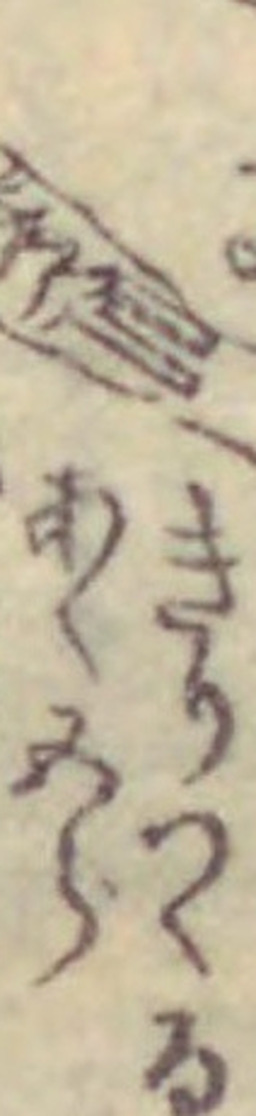あく五郎
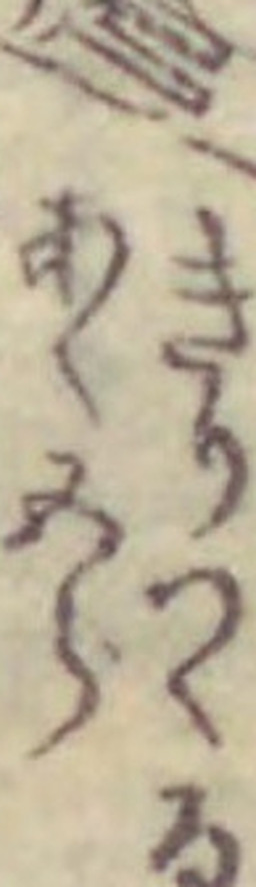あく五郎
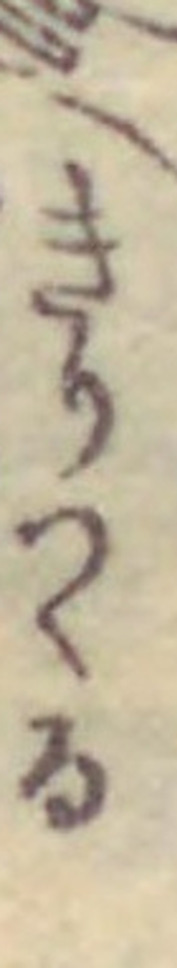きりつくる
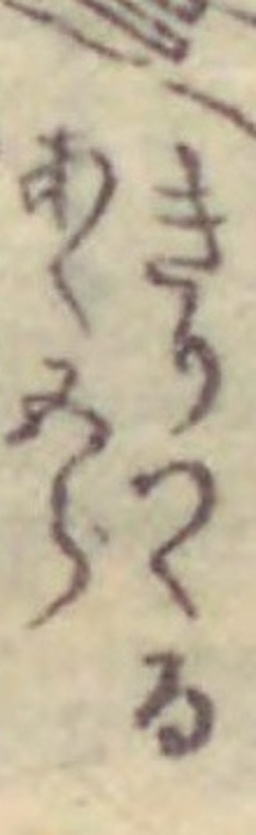あく五郎
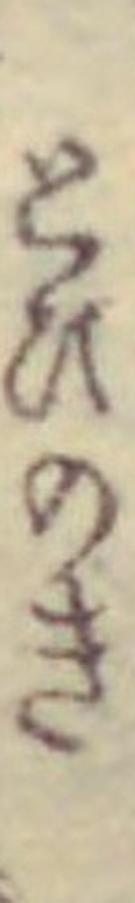とひのき
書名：八ツ目鱣因縁物語 3巻
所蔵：国立国会図書館 National Diet Library, JAPAN
